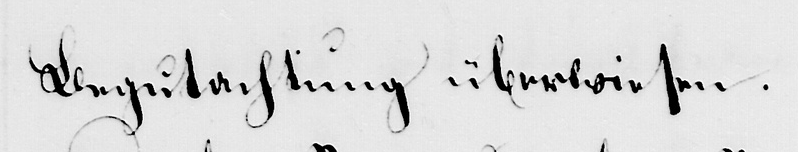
Begutachtung überwiesen.
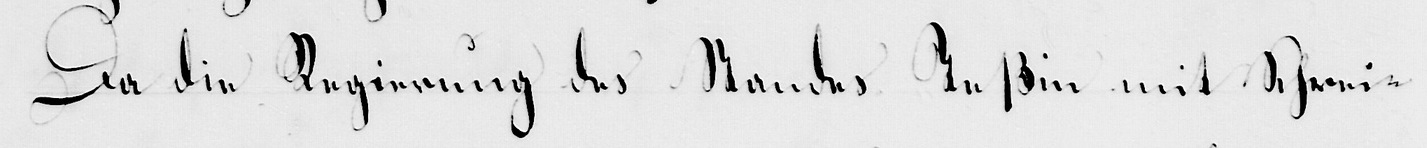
Da die Regierung des Standes Teßin mit Schrei¬
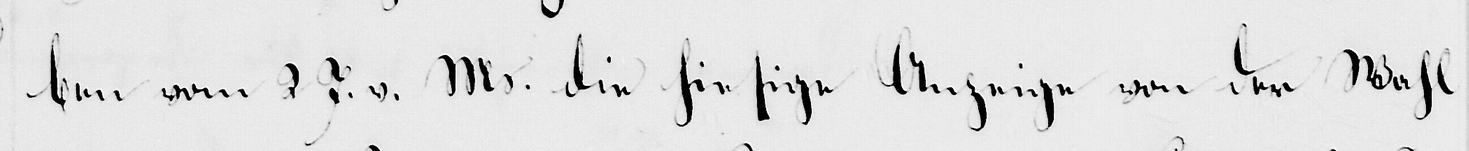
ben vom 27. v. Ms. die hiesige Anzeige von der Wahl
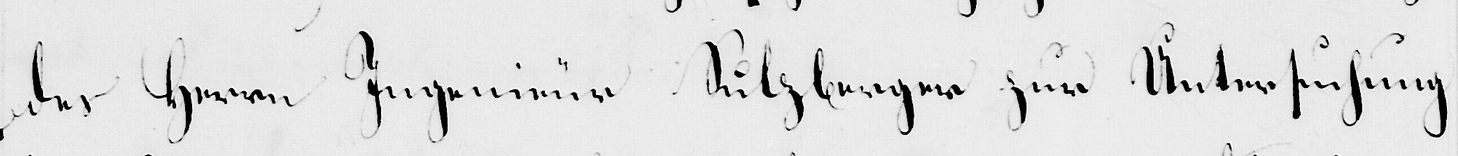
des Herrn Ingenieur Sulzberger zur Untersuchung
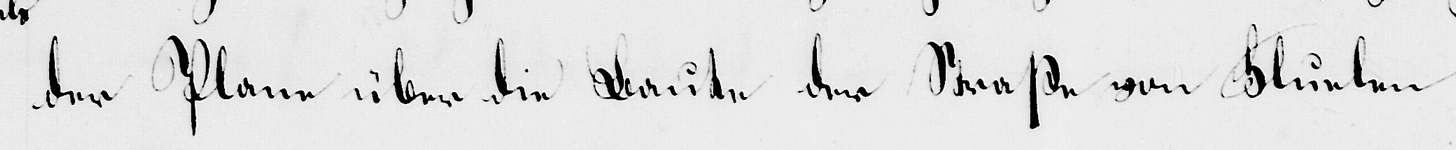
der Plane über die Baute der Strasse von Fluelen
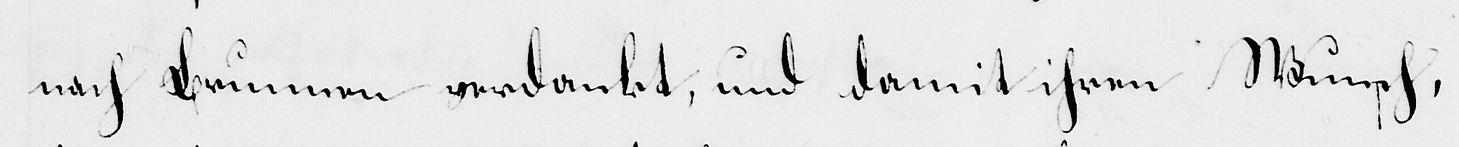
nach Brunnen verdankt, und damit ihren Wunsch,
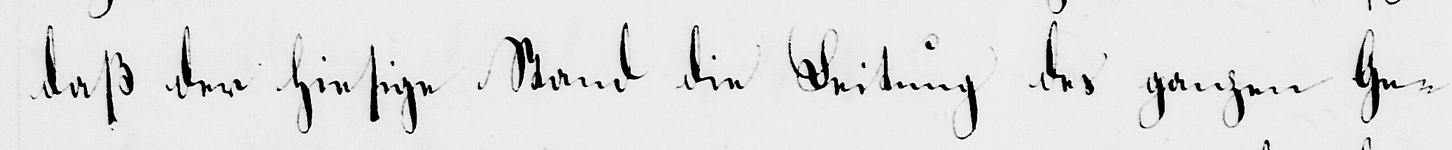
daß der hiesige Stand die Leitung des ganzen Ge¬
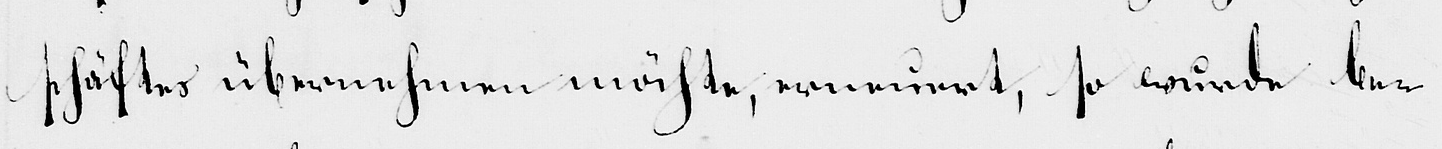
schäftes übernehmen möchte, erneuert, so wurde be¬
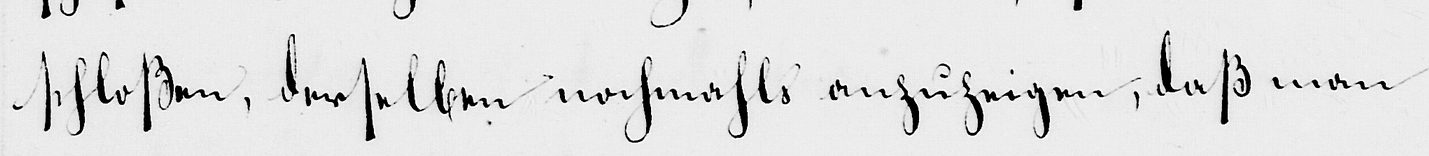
schloßen, derselben nochmahls anzuzeigen, daß man
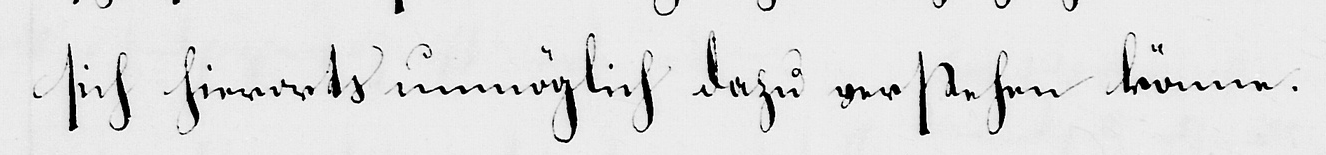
sich hierorts unmöglich dazu verstehen könne.
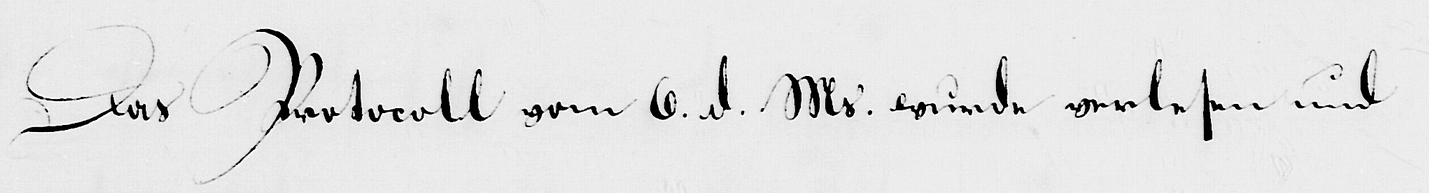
Das Protocoll vom 6. d. Ms. wurde verlesen und
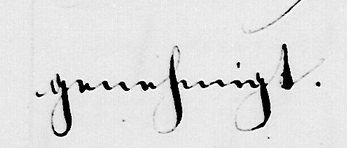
genehmigt.
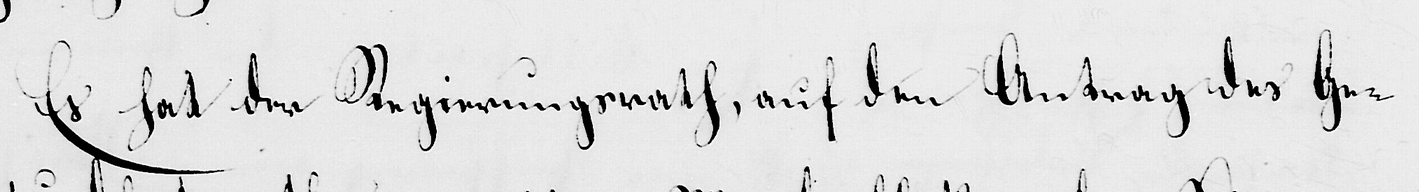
Es hat der Regierungsrath, auf den Antrag des Ge¬
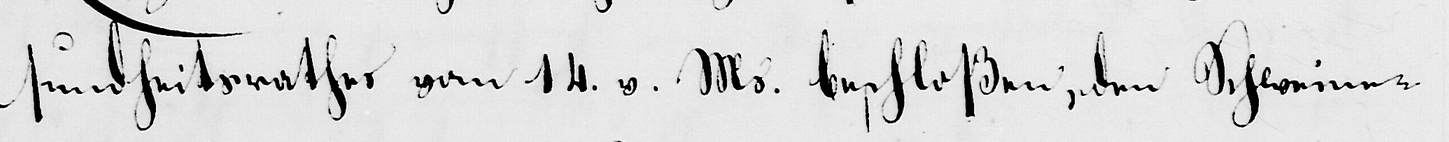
sundheitsrathes vom 14. v. Ms. beschloßen, den Schweine¬
